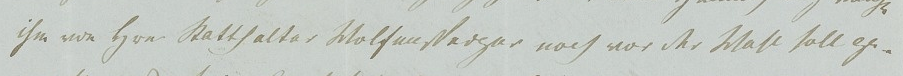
ihm von Hrn Statthalter Wolfensperger noch vor der Wahl soll ge-
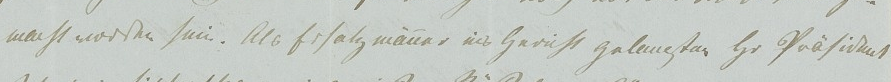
macht worden sein. Als Ersatzmänner ins Gericht gelangten Hr Präsident
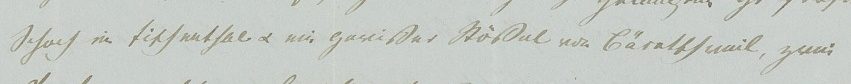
Schoch im Fischenthal & ein gewißer Stößel von Bäretschweil, zwei
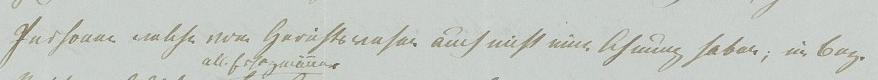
Personen welche vom Gerichtswesen auch nicht eine Ahnung haben; im Bez.
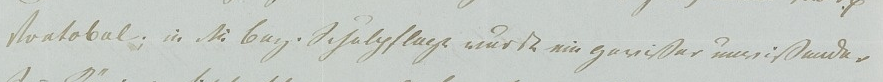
Vontobel; in die Bez.Schulpflege wurde ein gewißer unwißender
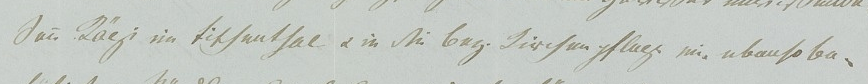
Senn Kägi im Fischenthal & in die Bez.Kirchenpflege ein ebenso be-
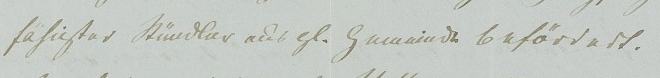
fähigter Stündler aus gl. Gemeinde befördert.
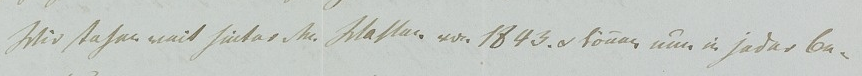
Wir stehen weit hinter den Wahlen von 1843. & können nun in jeder Be-
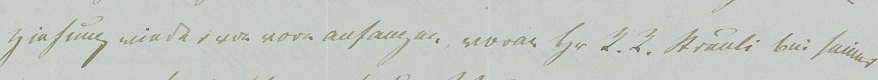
ziehung wieder von vorn anfangen, woran Hr R.R. Streuli bei seiner
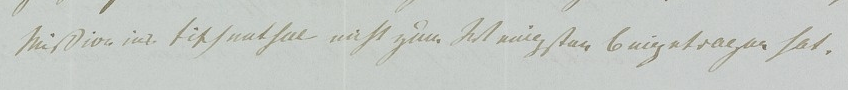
Mißion ins Fischenthal nicht zum Wenigsten beigetragen hat.
